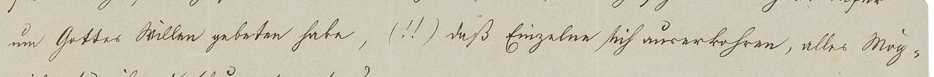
um Gottes Willen gebeten habe, (!!) daß Einzelne sich auserkohren, alles Mög-
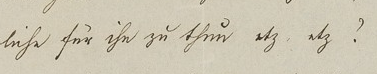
liche für ihn zu thun etz etz?
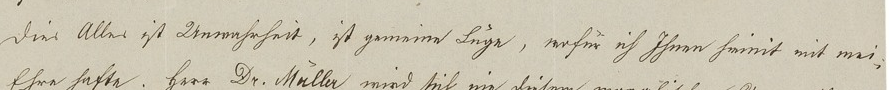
Dies Alles ist Unwahrheit, ist gemeine Lüge, wofür ich Ihnen hiemit mit mei-
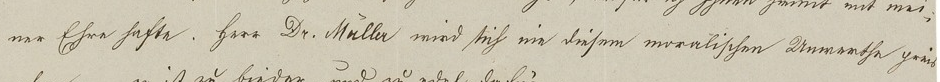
ner Ehre hafte. Herr Dr. Müller wird sich nie diesem moralischen Unwerthe preis-
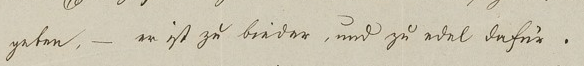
geben, – er ist zu bieder, und zu edel dafür.
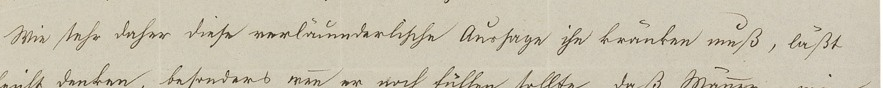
Wie sehr daher diese verläumderlische Aussage ihn kränken muß, läßt
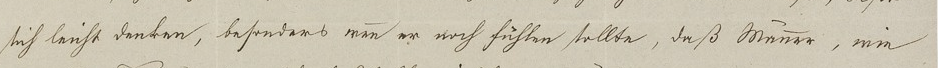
sich leicht denken, besonders wenn er noch fühlen sollte, daß Männer, wie
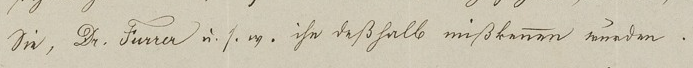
Sie, Dr. Furrer u. s. w. ihn deßhalb mißkennen würden.
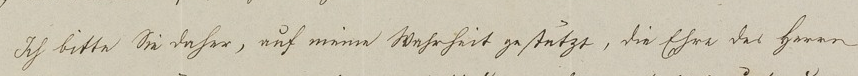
Ich bitte Sie daher, auf meine Wahrheit gestützt, die Ehre des Herrn
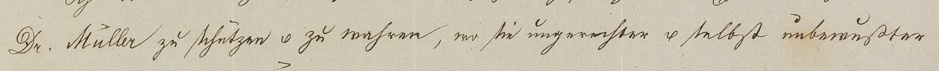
Dr. Müller zu schützen & zu wahren, wo sie ungerechter & selbst unbewußter
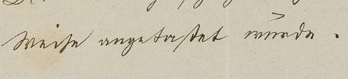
Weise angetastet wurde.
